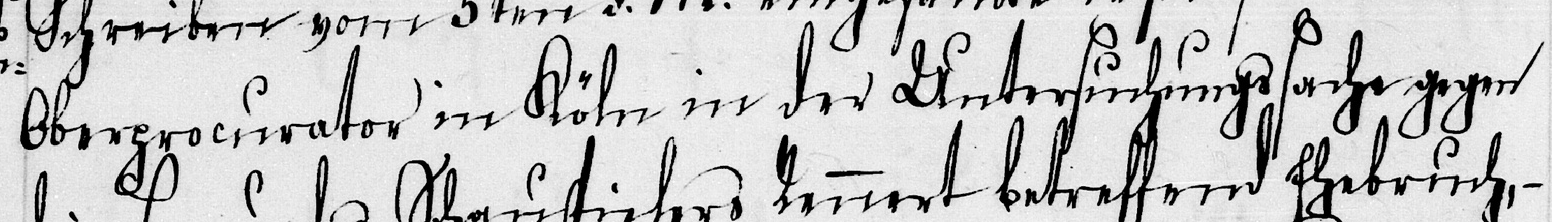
Oberprocurator in Köln in der Untersuchungssache gegen
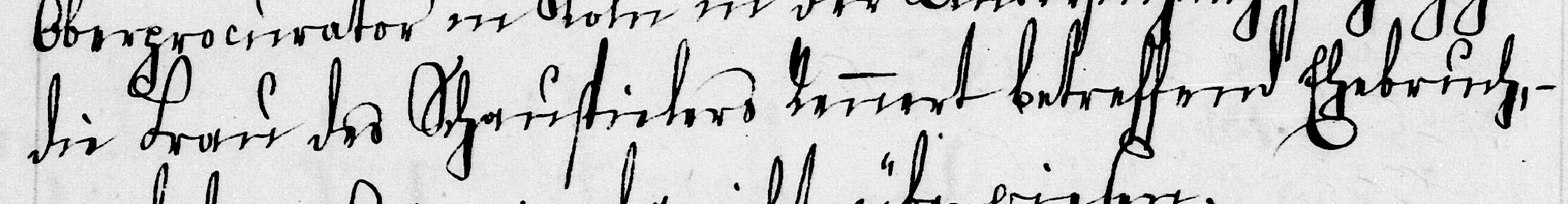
die Frau des Schauspielers Rennert betreffend Ehebruch,
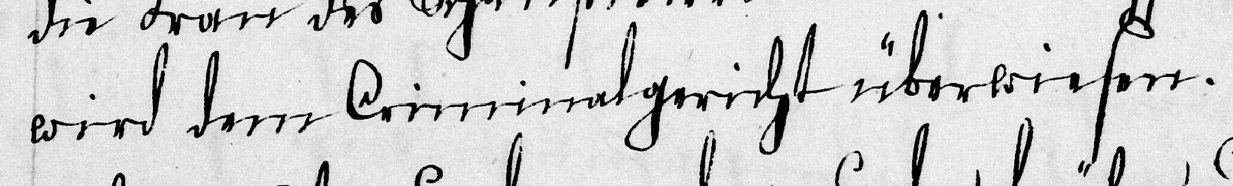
wird dem Criminalgericht überwiesen.
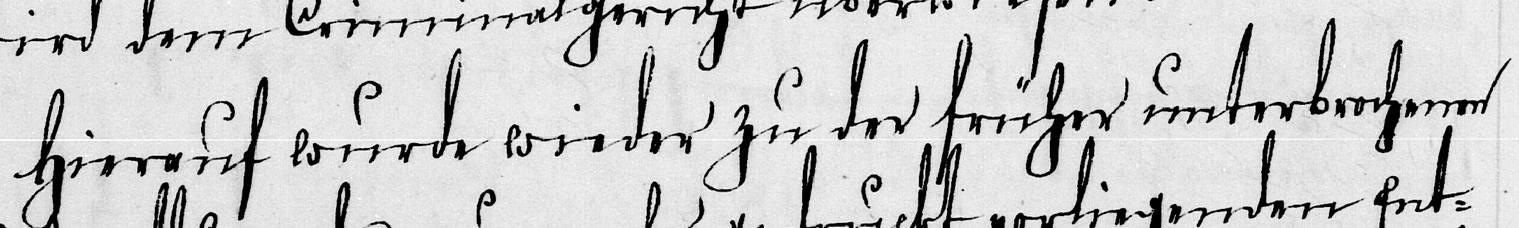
Hierauf wurde wieder zu der früher unterbrochenen
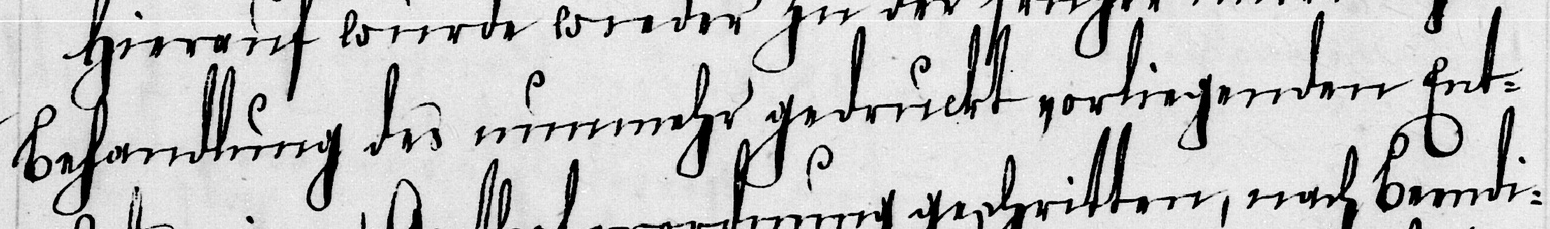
Behandlung des nunmehr gedruckt vorliegenden Ent¬
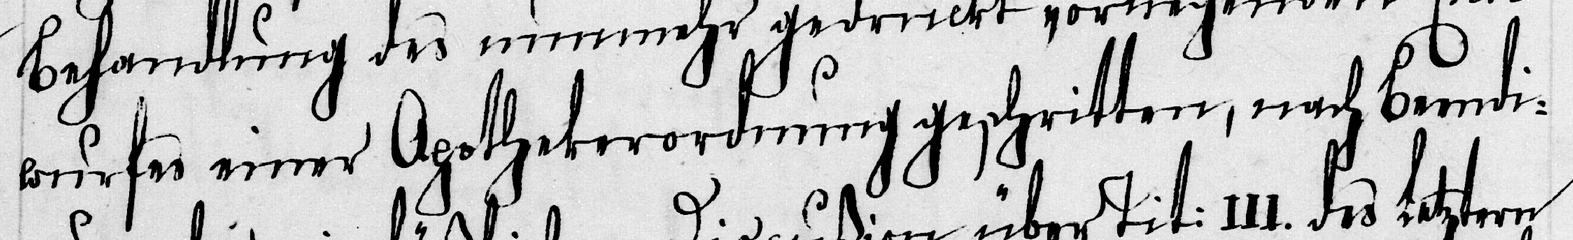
wurfes einer Apothekerordnung geschritten, nach Beendi¬
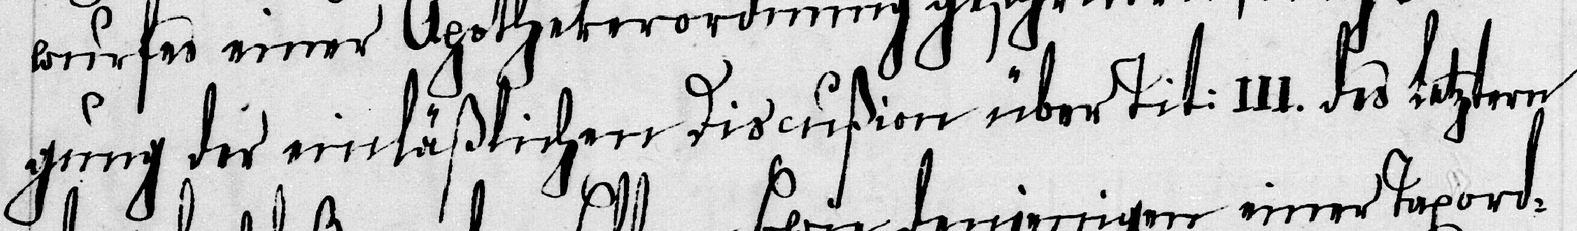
gung der einläßlichen Discußion über Tit: III. des Letztern
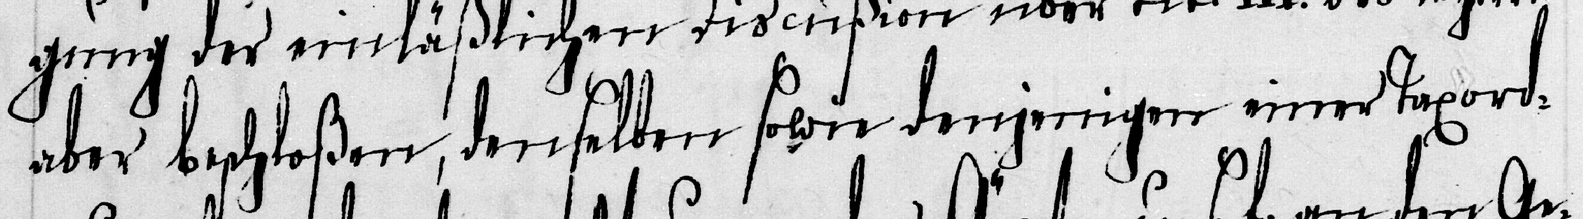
aber beschloßen, denselben sowie denjenigen einer Taxord¬
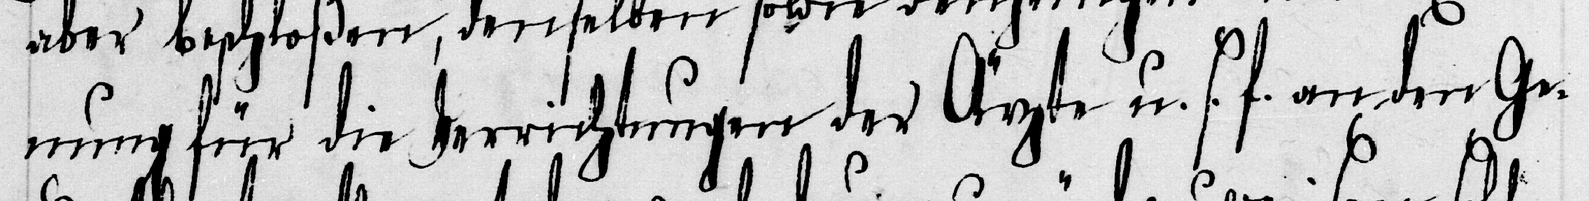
nung für die Verrichtungen der Ärzte u.s.f. an den Ge¬
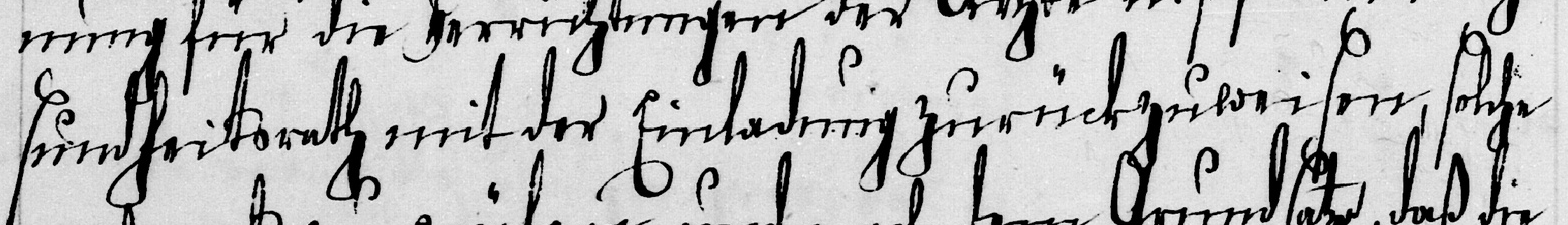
sundheitsrath mit der Einladung zurückzuweisen, solche
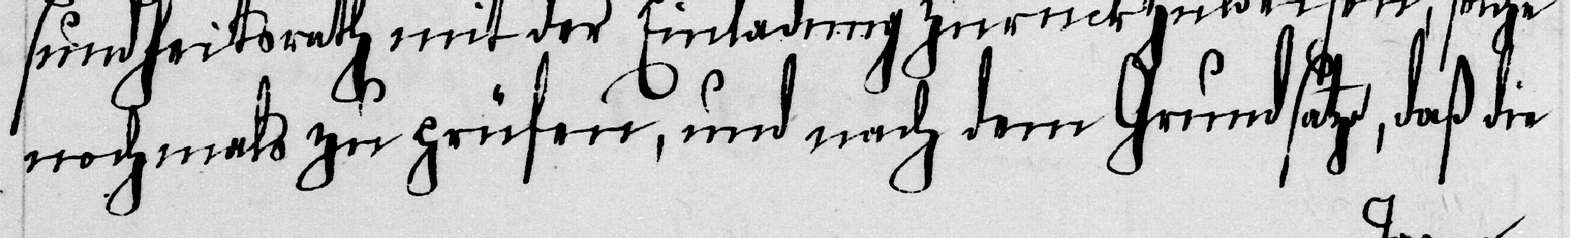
nochmals zu prüfen, und nach dem Grundsatze, daß d¬
